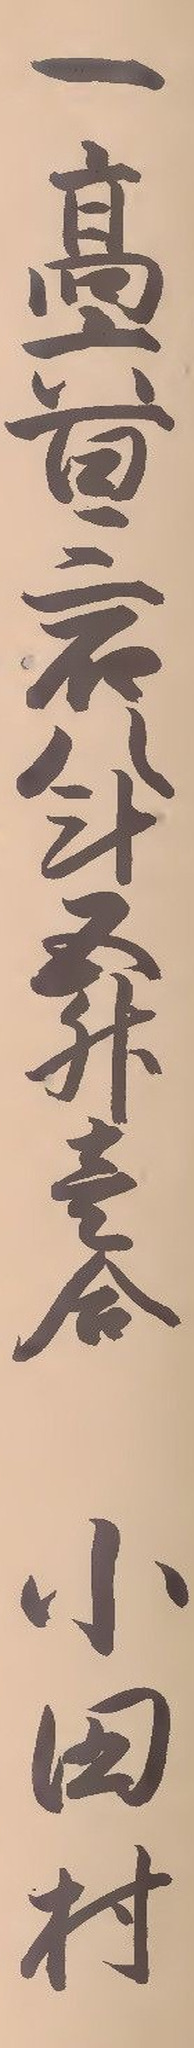一高六百三石八斗五升壱合小田村
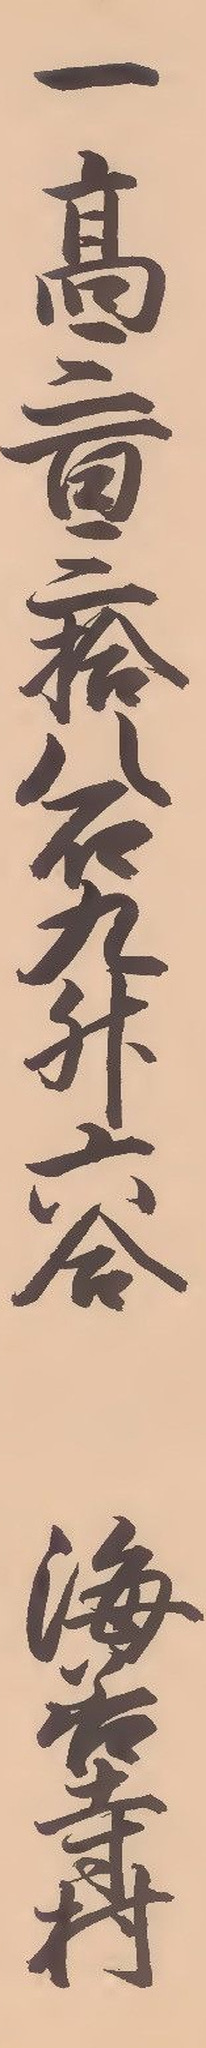一高三百三拾八石九升六合海善寺村
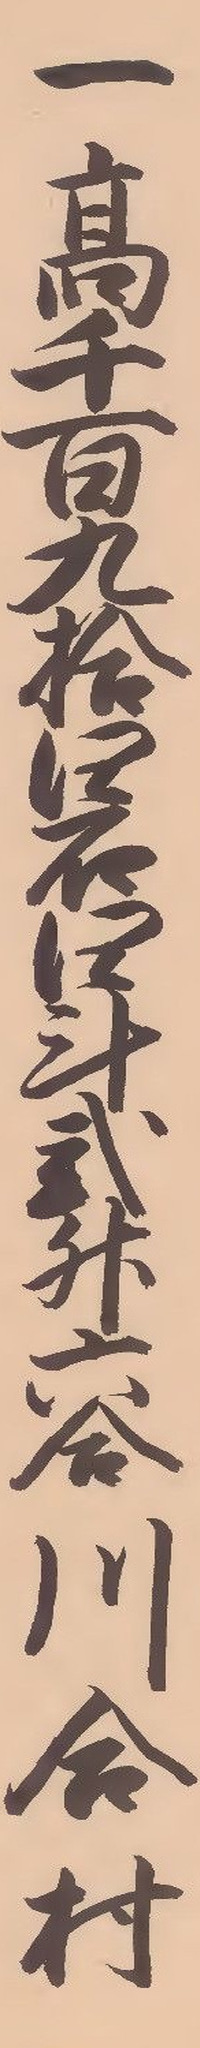一高千百九拾四石四斗弐升六合川合村
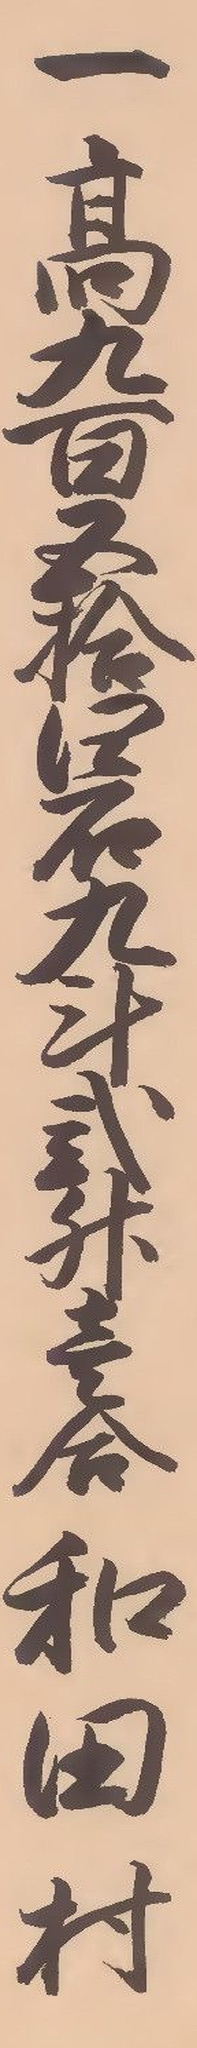一高九百五拾四石九斗弐升壱合和田村

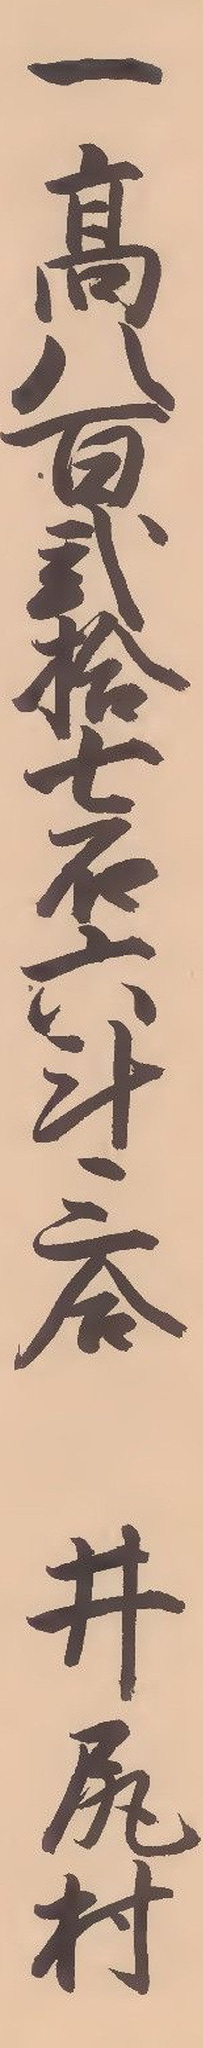一高八百弐拾七石六斗三合井尻村
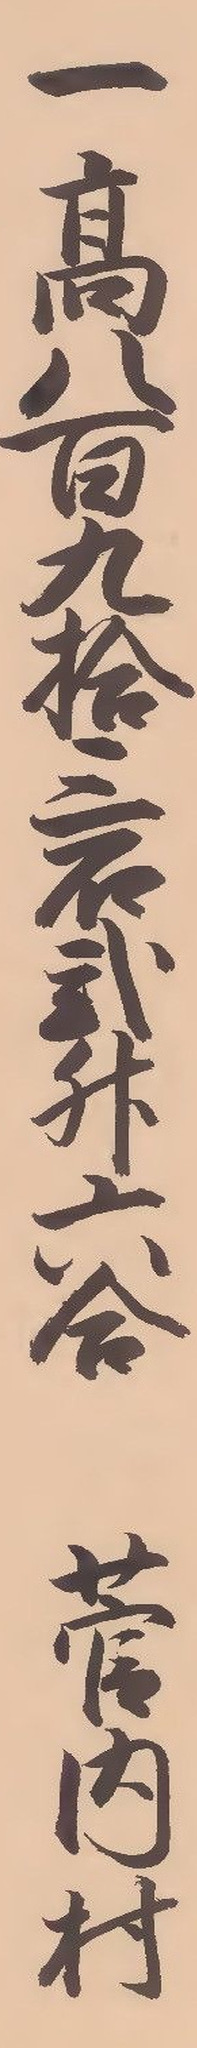一高八百九拾三石弐升六合菅内村
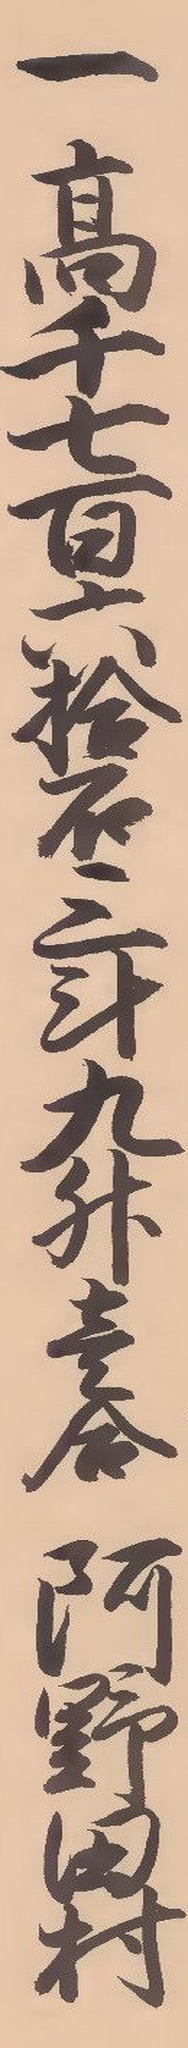一高千七百六拾石三斗九升壱合阿野田村
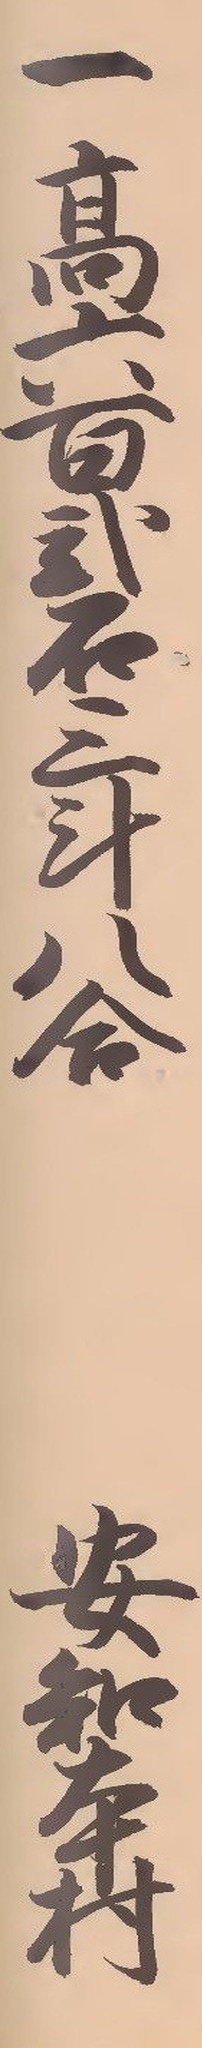一高六百弐石三斗八合安知本村
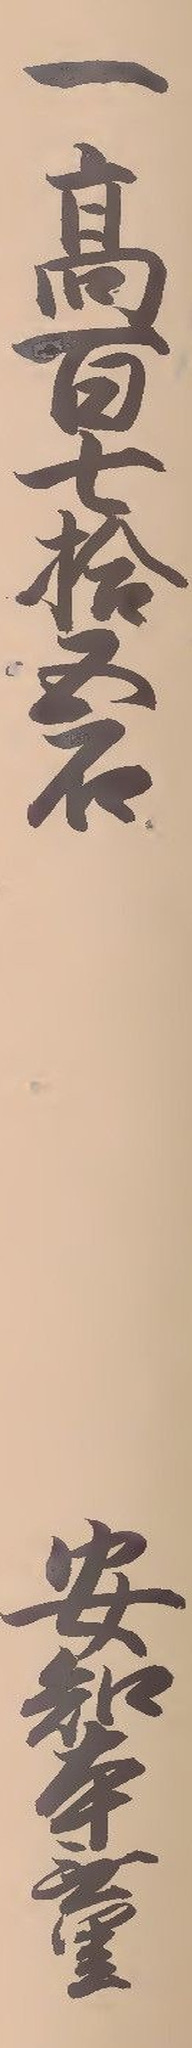一高百七拾五石安知本無里
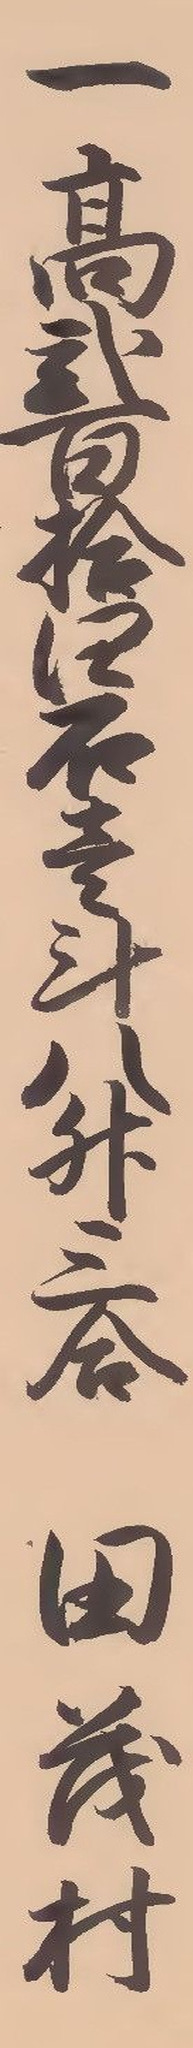一高弐百拾四石壱斗八升三合田茂村
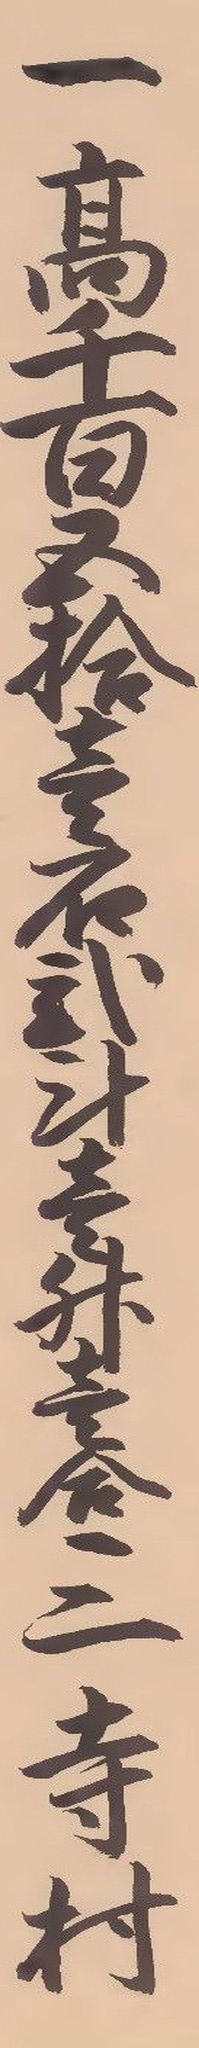一高千百五拾壱石弐斗壱升壱合三寺村
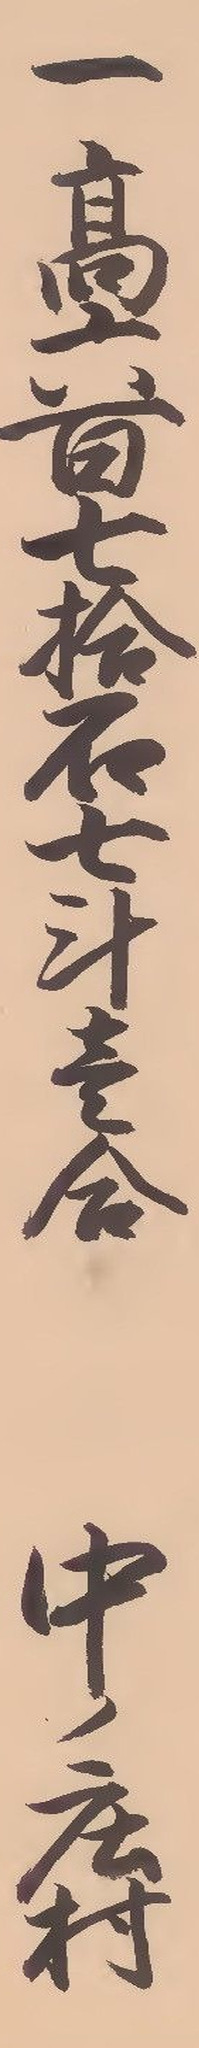一高六百七拾石七斗壱合中ノ庄村

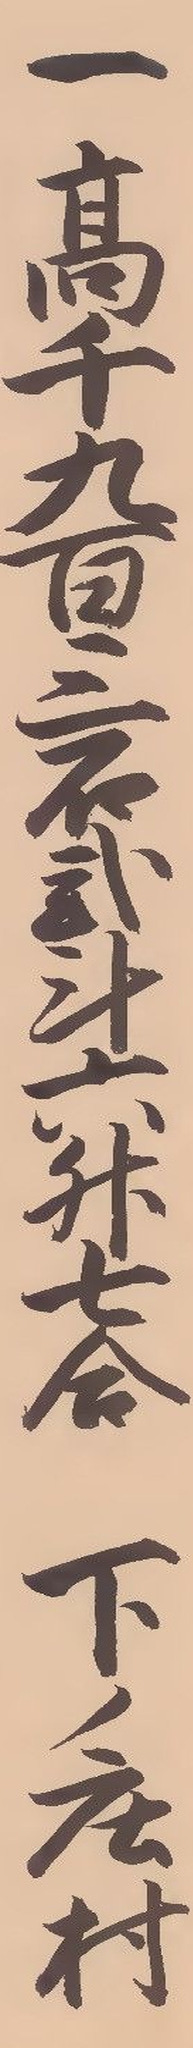一高千九百三石弐斗六升七合下ノ庄村
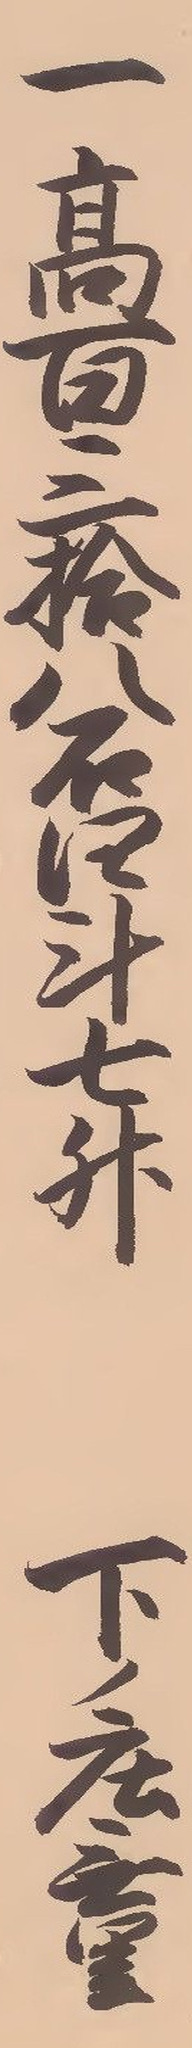一高百三拾八石四斗七升下ノ庄無里
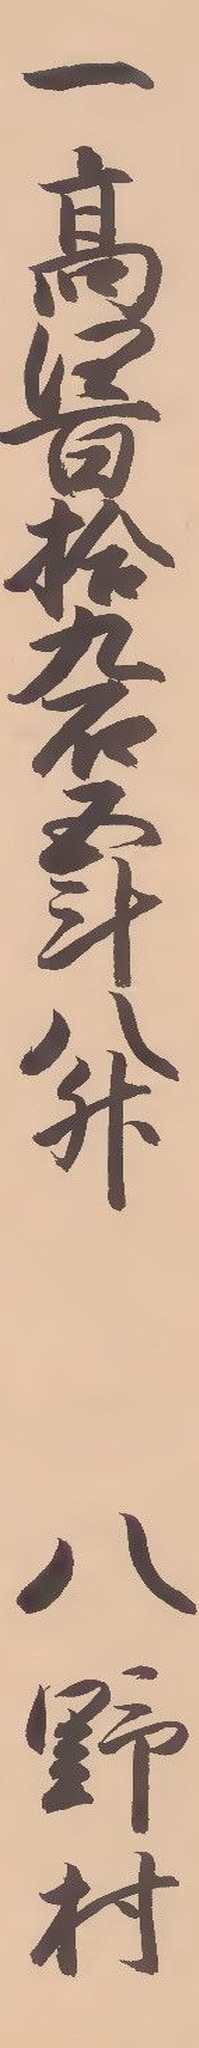一高四百拾九石五斗八升八野村
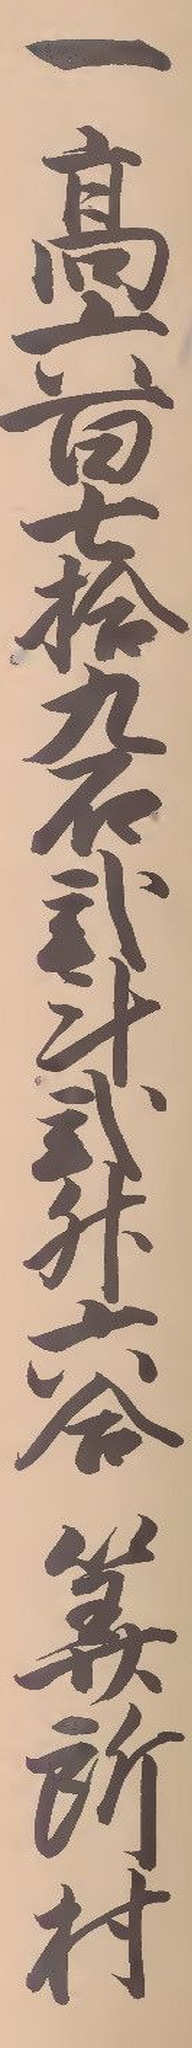一高六百七拾九石弐斗弐升六合算所村
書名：伊勢国郷帳
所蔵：国立公文書館 National Archives of Japan
